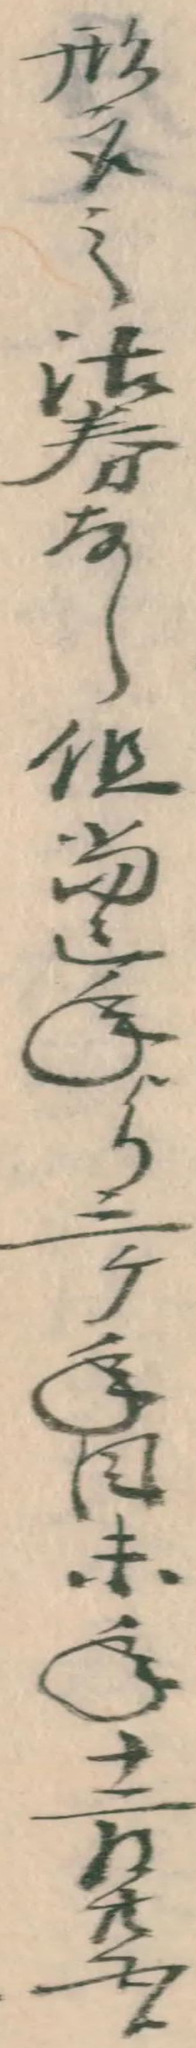形取之沽券なし但當巳年より三ヶ年目未年十二月廿五日
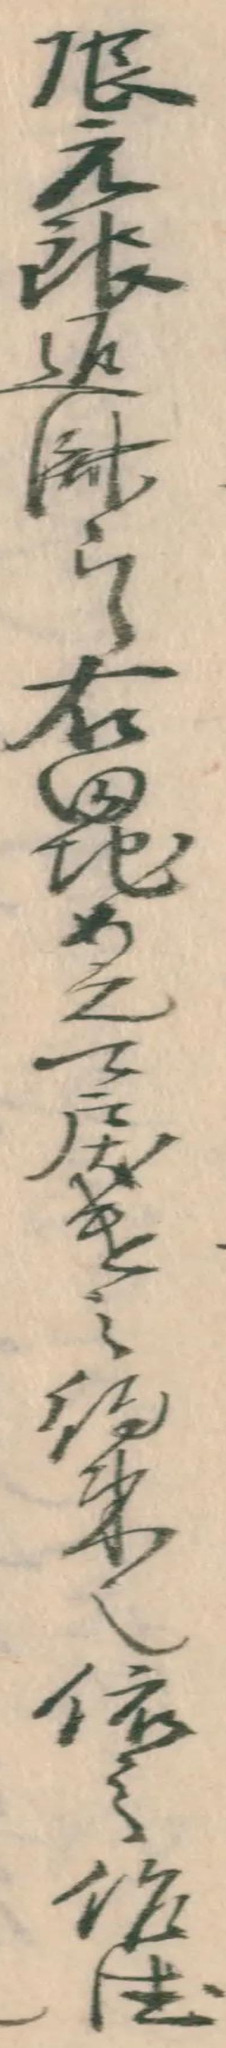限元銀返済候ハヽ右田地如元可戻遣之約束也依之作法
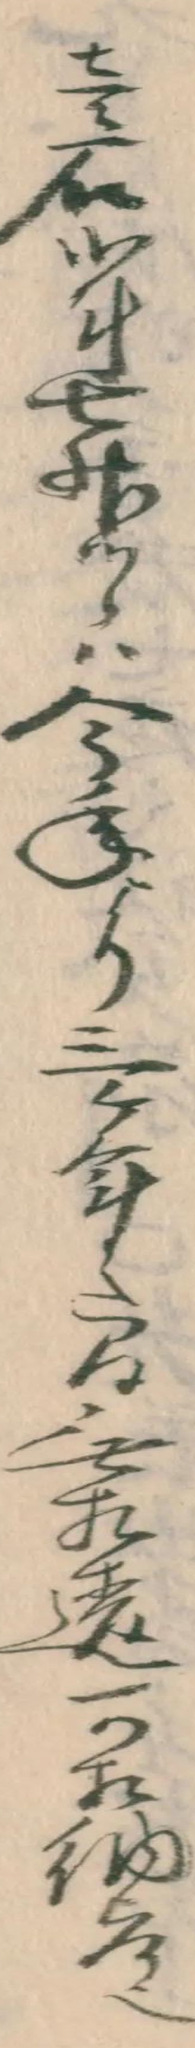壱石弐斗七升ツヽハ今年より三ヶ年之間無相違可相納旨也
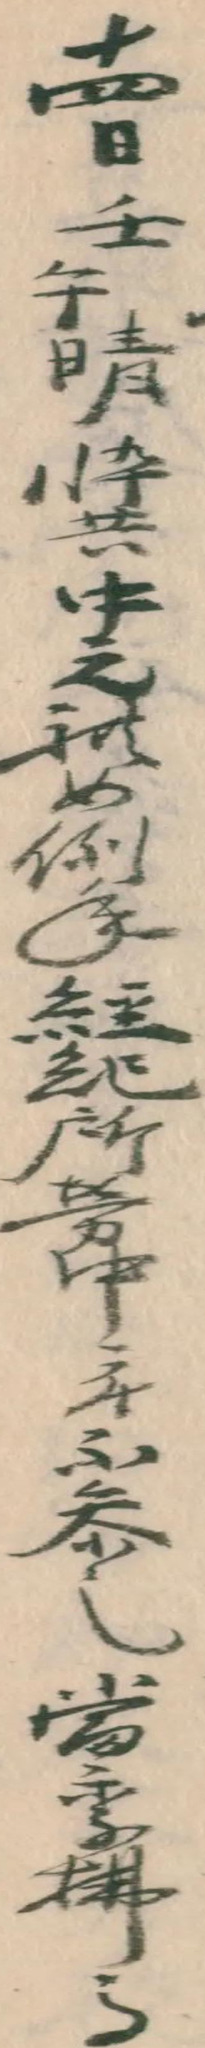十四日壬午晴忰共中元礼如例年経紀所労中ニ付不参也當季払高
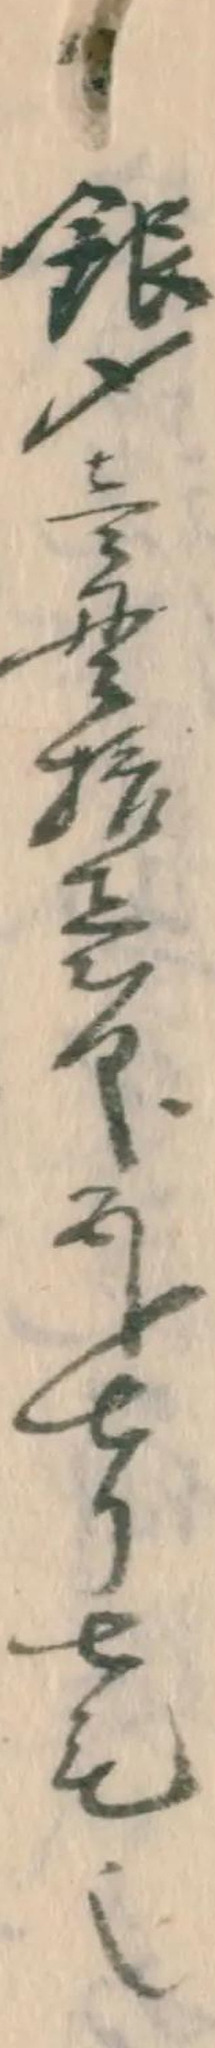銀〆壱貫拾壱匁五分七厘七毛宛之
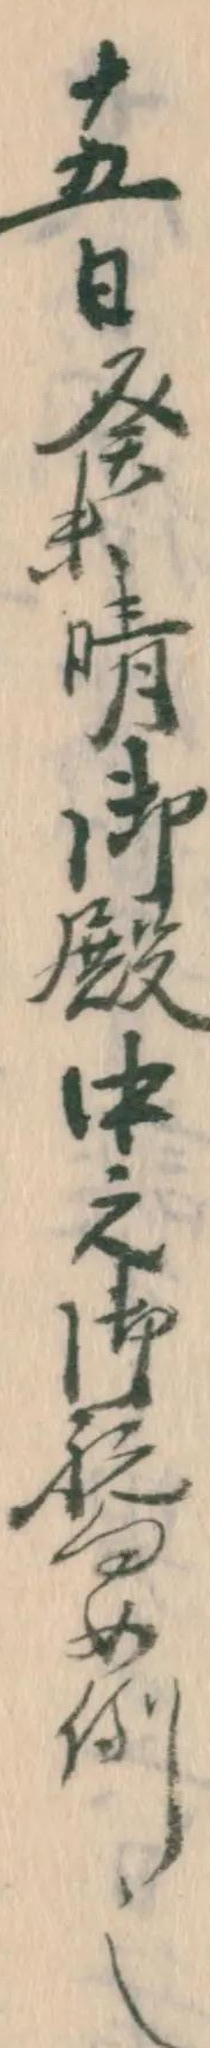十五日癸未晴御殿中元御祝向如例也
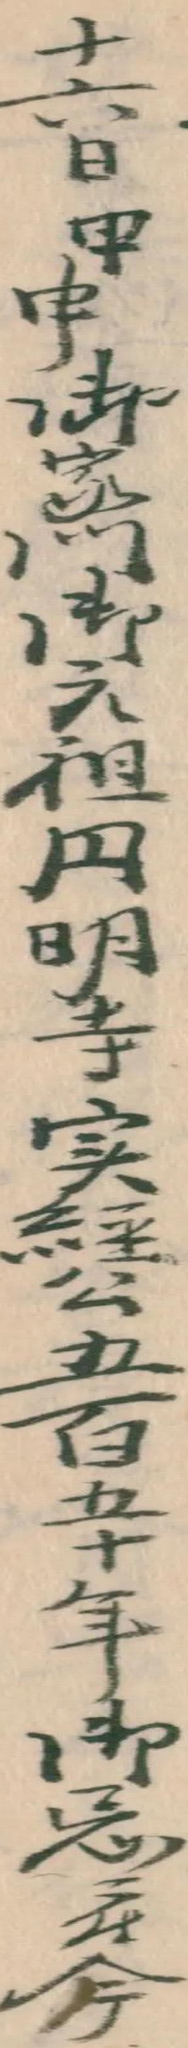十六日甲申御家門御取祖円明寺実経公五百五十年御忌ニ付今
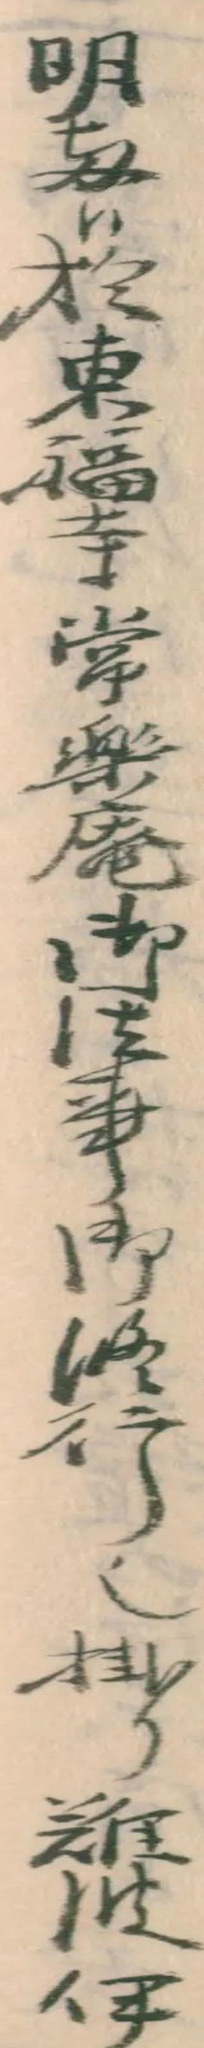明両日於東福寺常楽庵御法事御修行也掛り難波伊
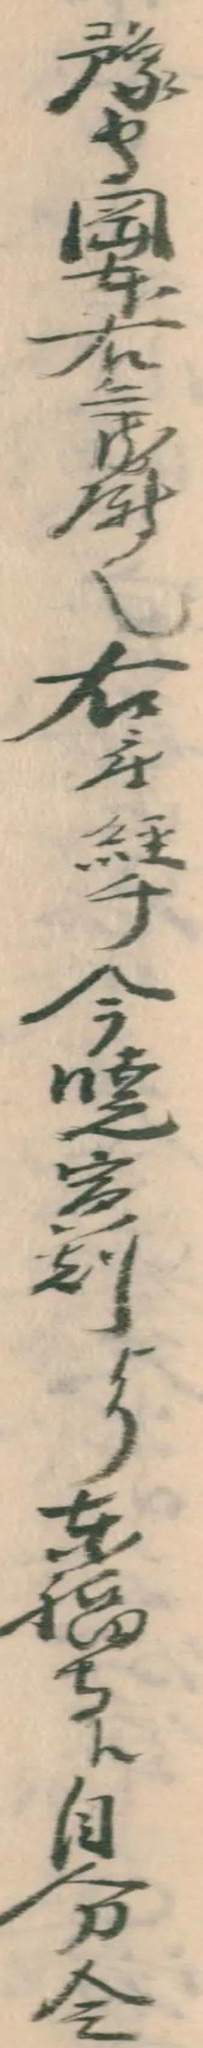豫守岡本右兵衛尉也右ニ付経千今晩寅刻より東福寺え自分令
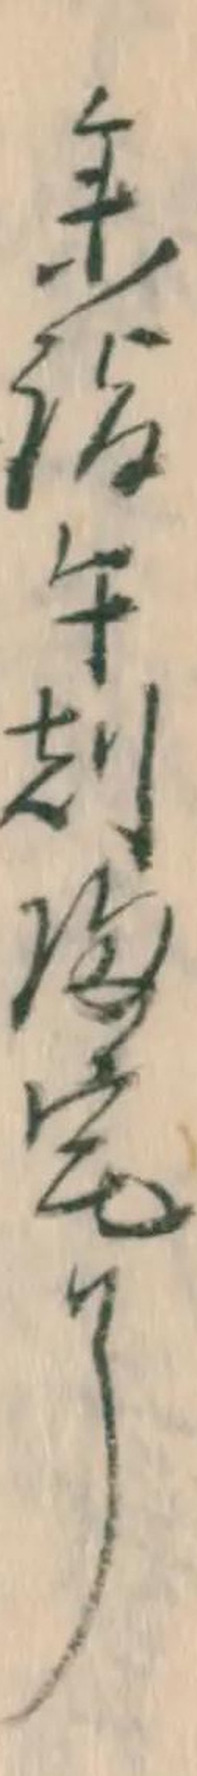参詣午刻帰宅了
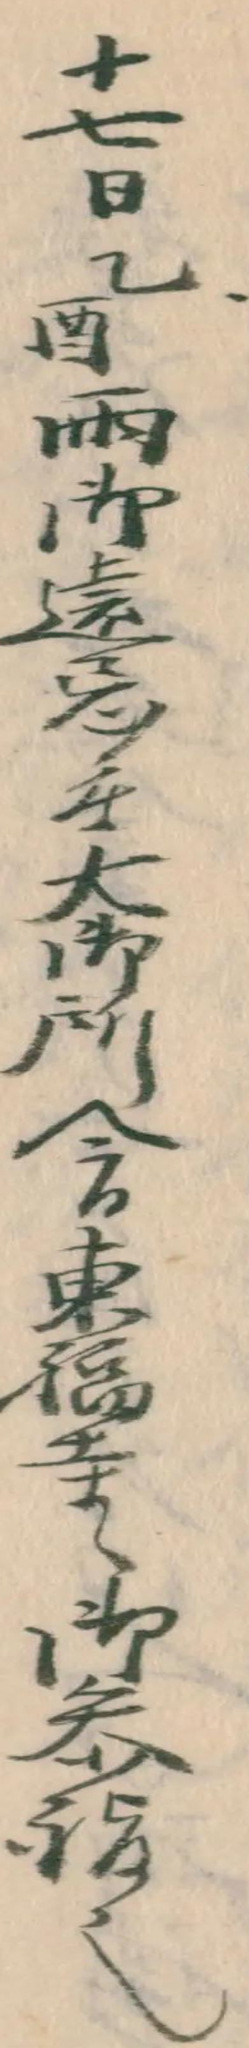十七日乙酉雨御遠忌ニ付大御所今日東福寺へ御参詣也
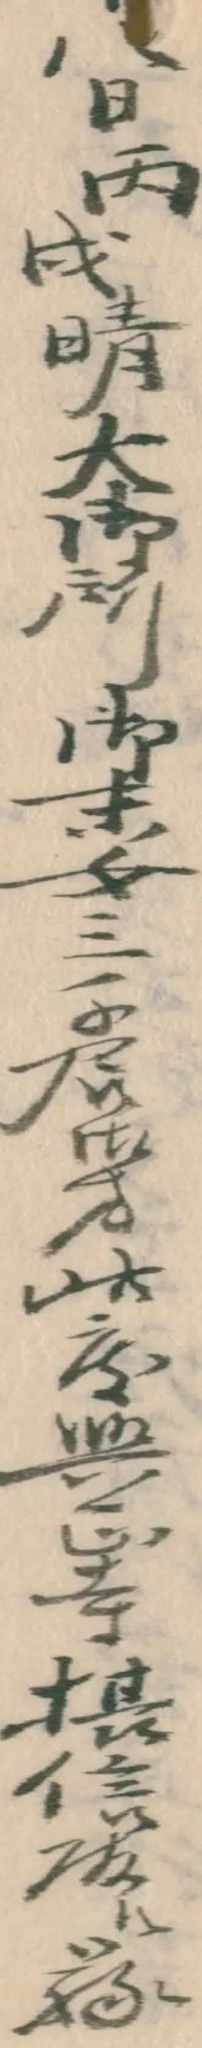廿八日丙戌晴大御所御末女三千居御方此度興正寺摂信殿え御縁
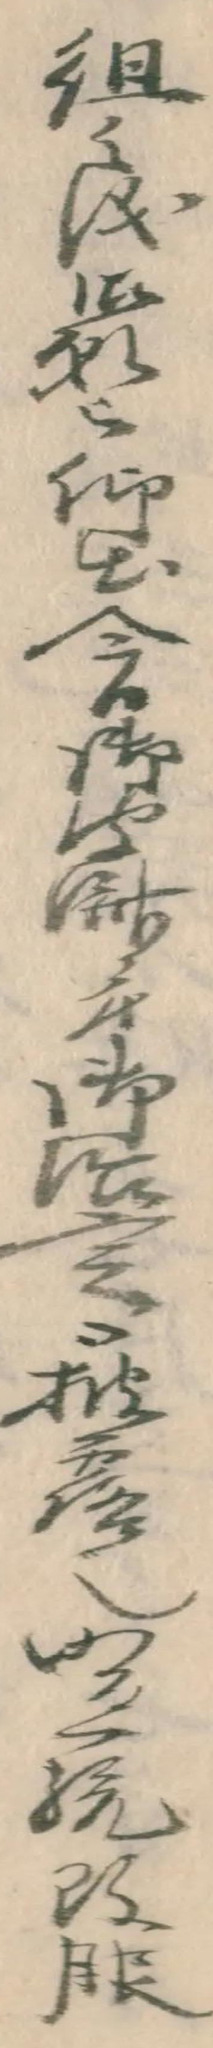組之儀御願被仰出今日御聞済ニ付御治定御披露也仍而一統改服
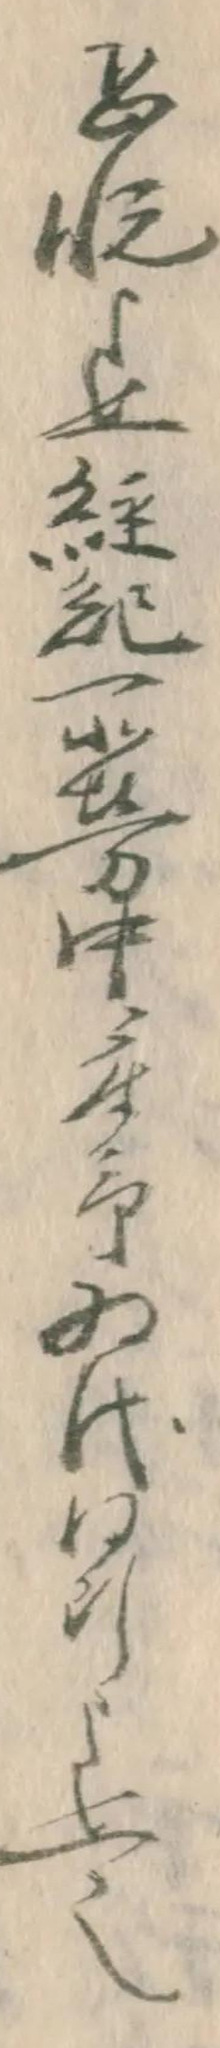恐悦申上経紀所労中ニ付予為代同断申上也
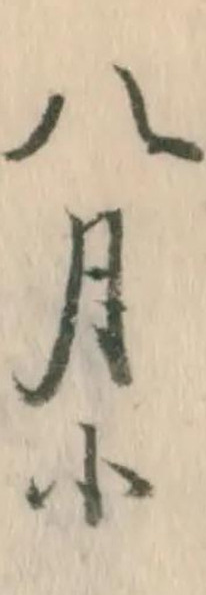八月小
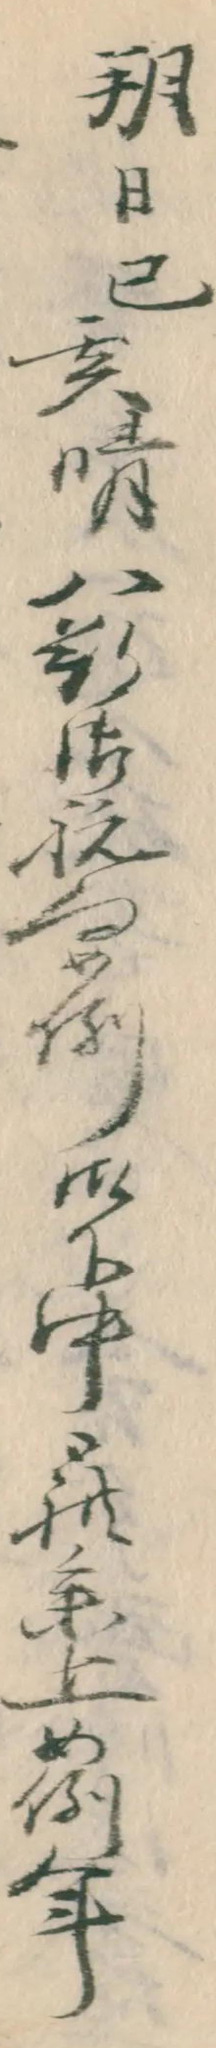朔日己亥晴八朔御祝向如例御下中御礼参上如例年
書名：賀茂社記録. 第66冊
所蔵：国立国会図書館 National Diet Library, JAPAN
